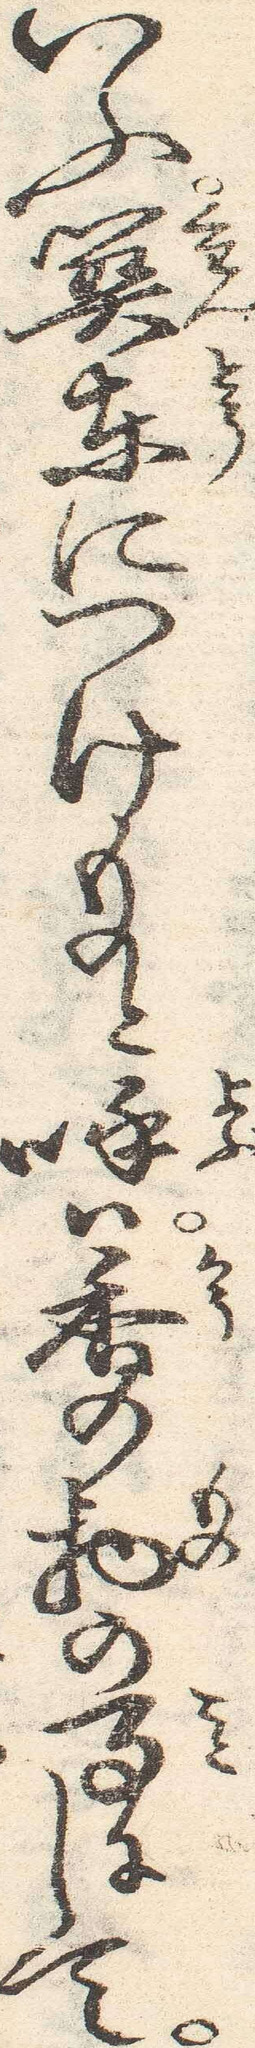いふ。関東につけものと呼は。香の物の事にして。
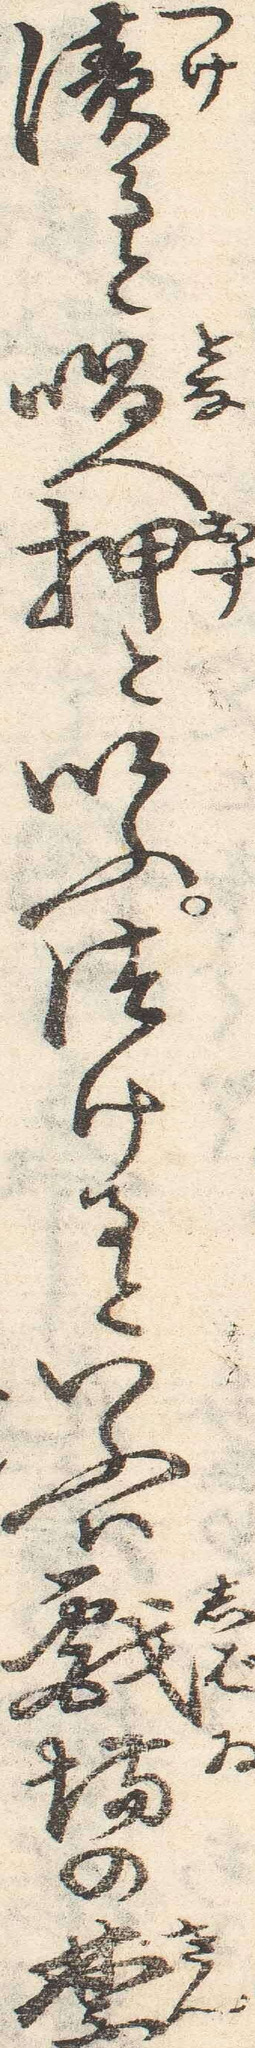漬ると唱へ押といふ。つけるといふは戯場の禁
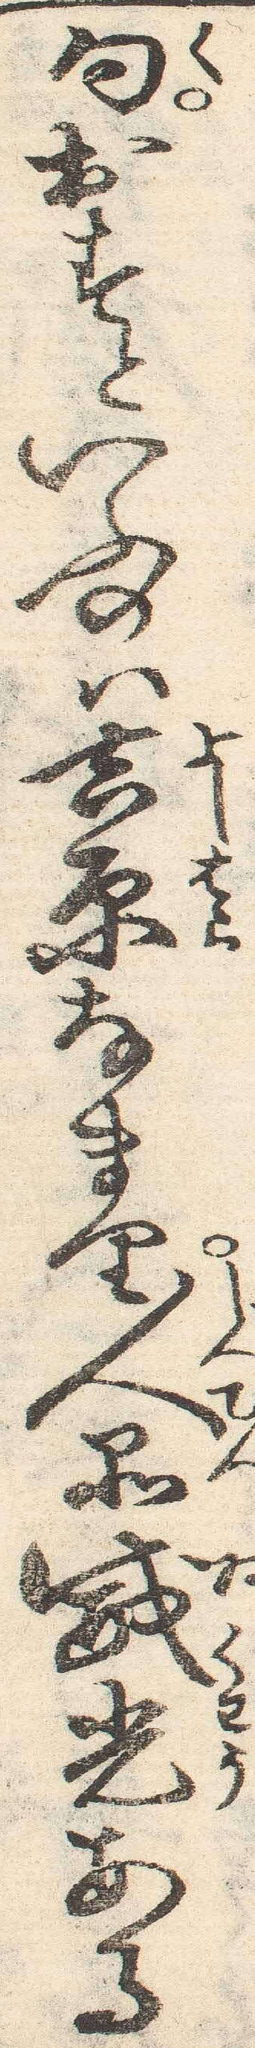句。おすといふのは吉原なまり。人品威光ある

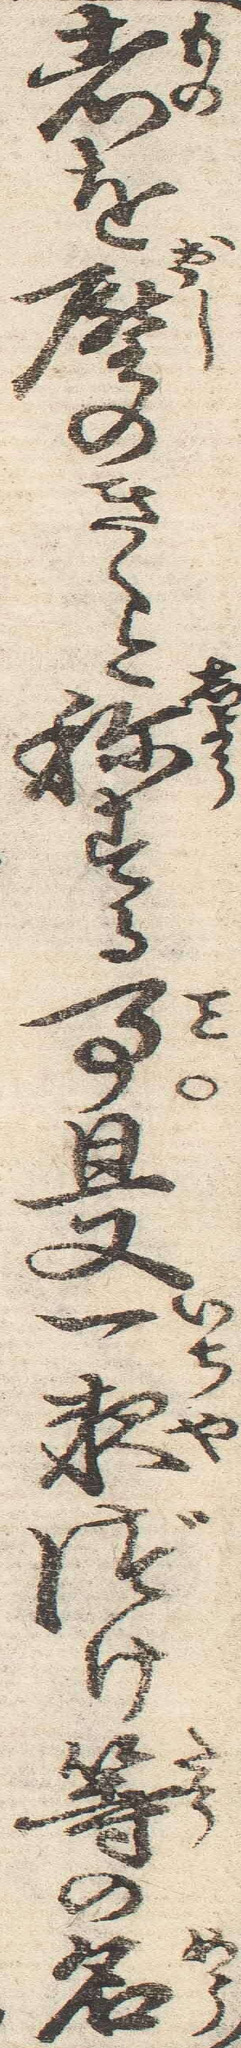者を圧のきくと称する事。且又一夜づけ等の名
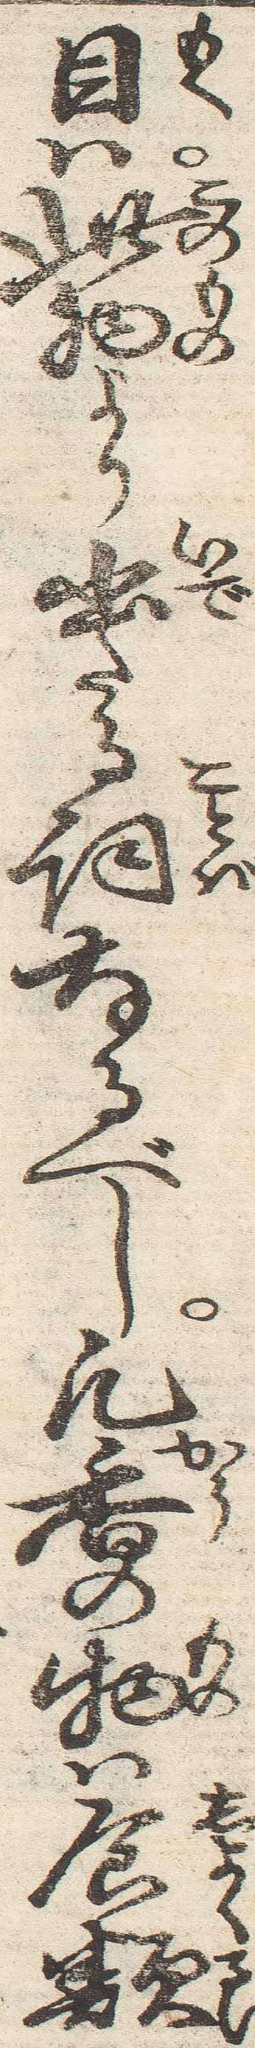目は。此物より出たる詞なるべし。凡香の物は食類
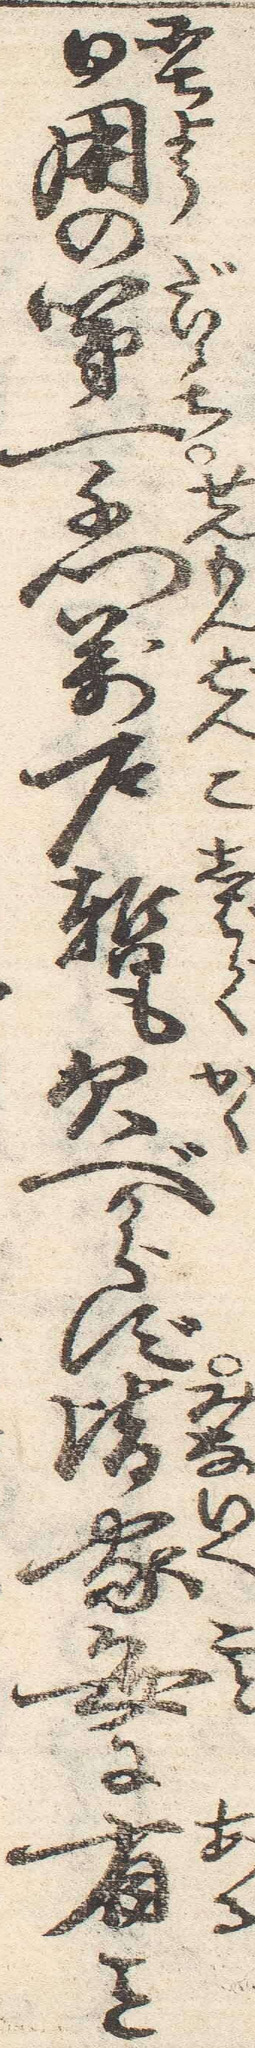日用の第一。千門萬戸暫も欠べからず。皆家毎に有こと
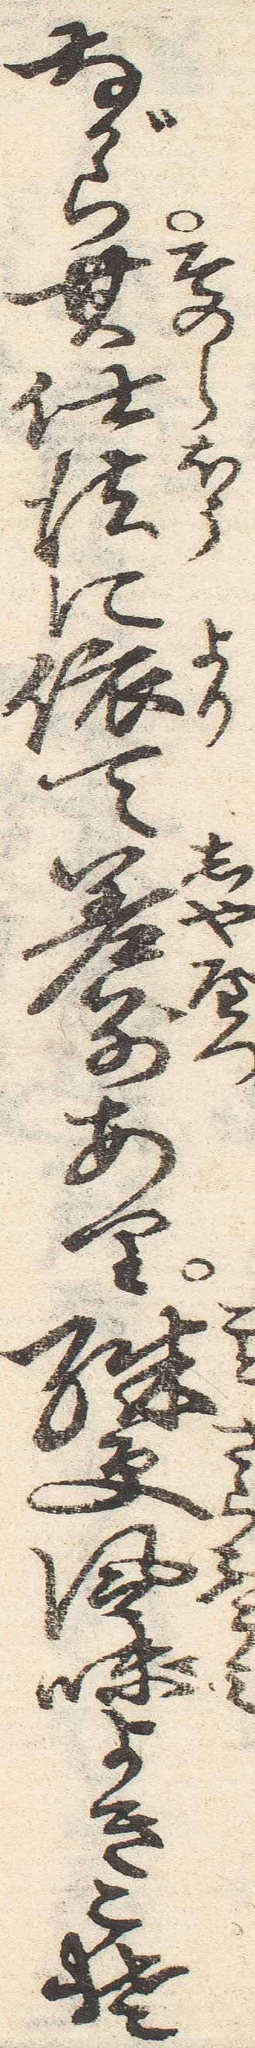ながら。其仕法に依て差別あり。殊更風味よきこそ
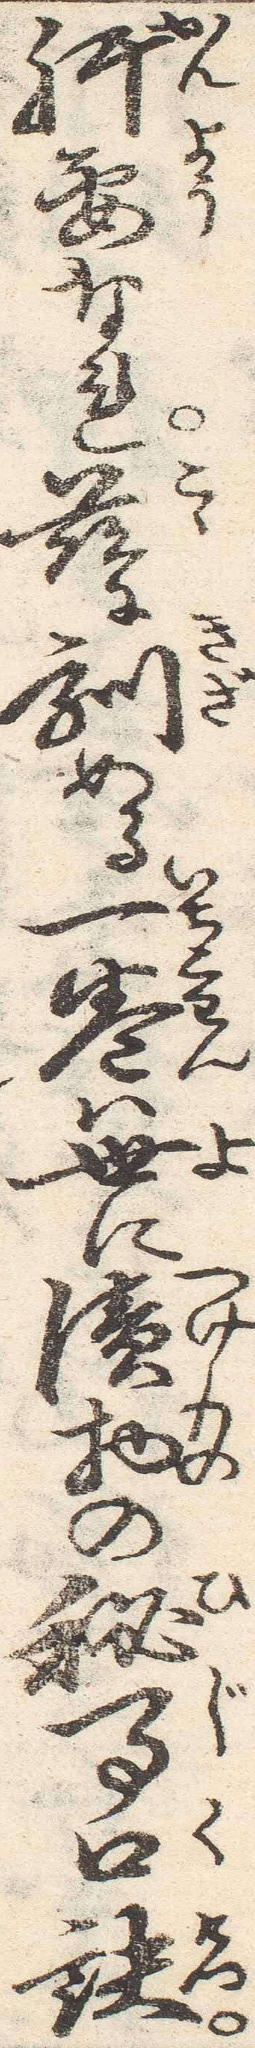肝要なれ。茲に刻める一巻は世に漬物の秘事口訣。
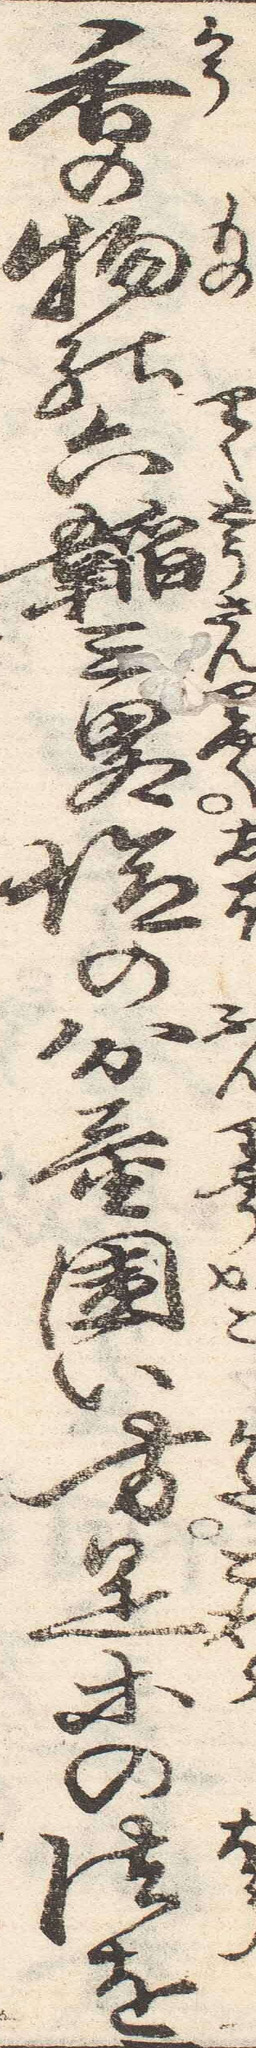香の物の六韜三略。塩の分量囲い方。是等の法を
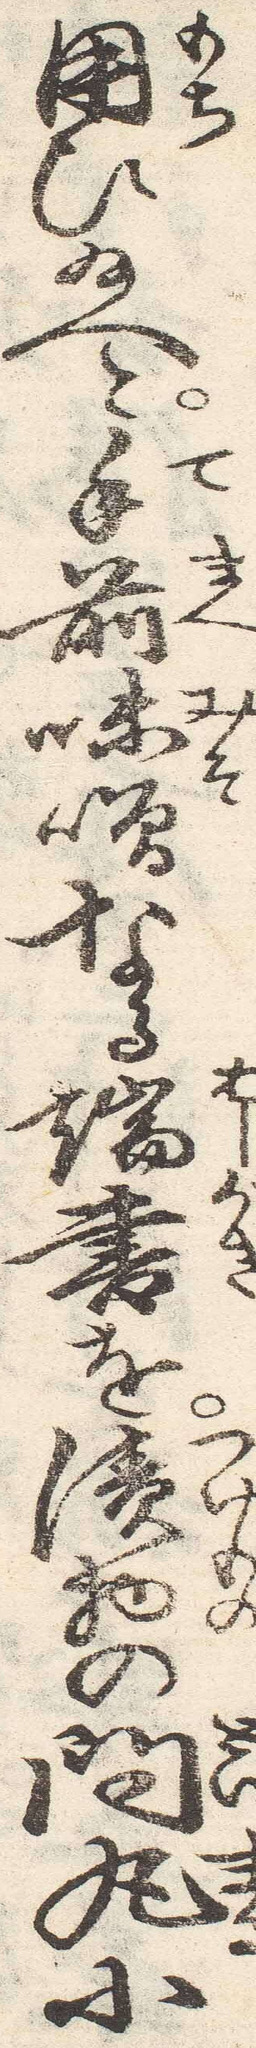用ひ給へと。手前味噌なる端書を。漬物の問丸小
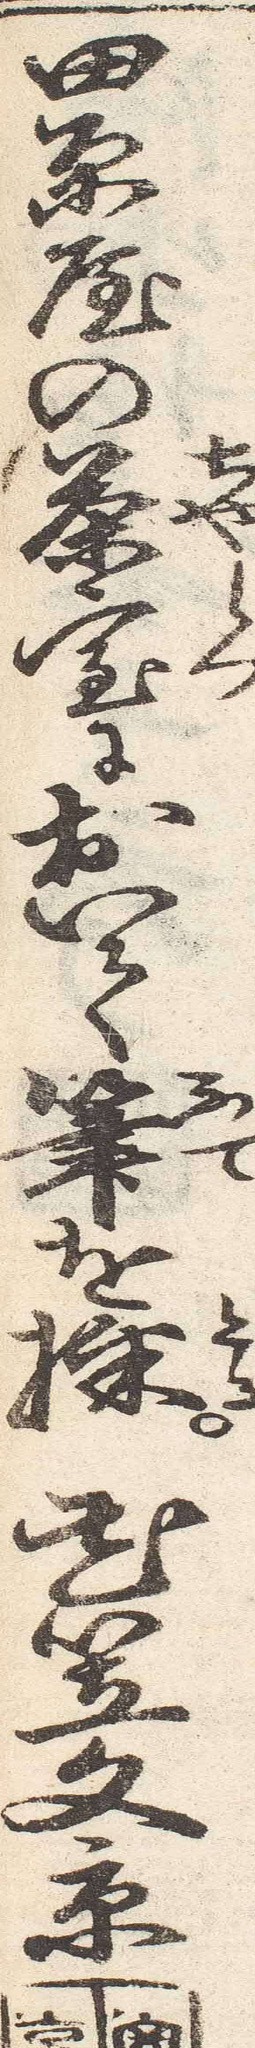田原屋の茶室において筆を採。花笠文京
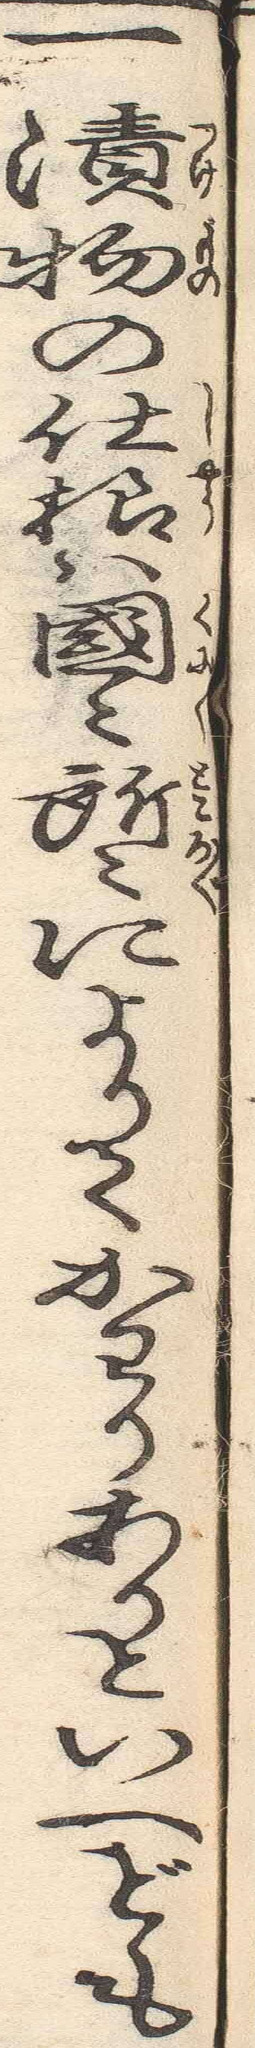一漬物の仕様は国々所々によりてかわりありといへども
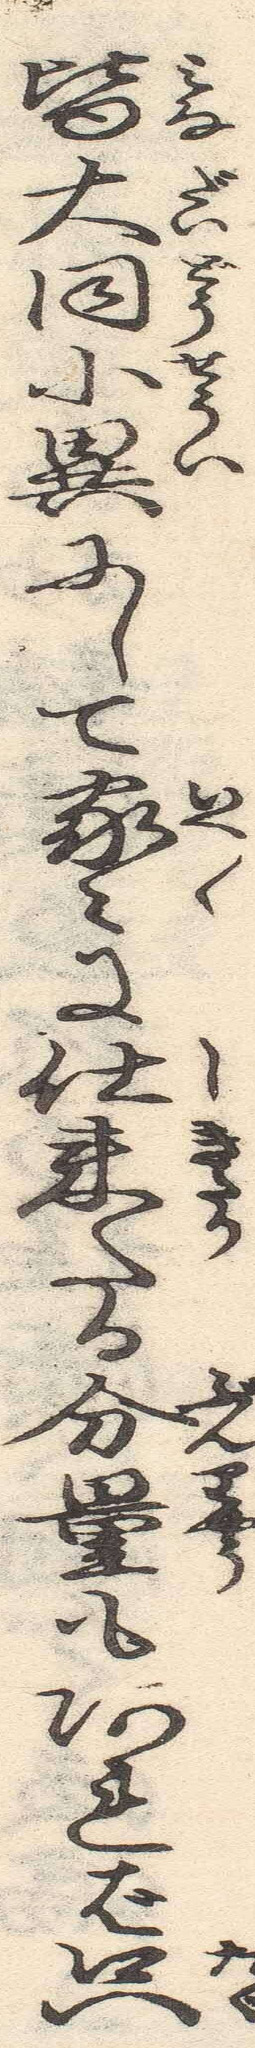皆大同小異にして家々に仕来たる分量もあれば只
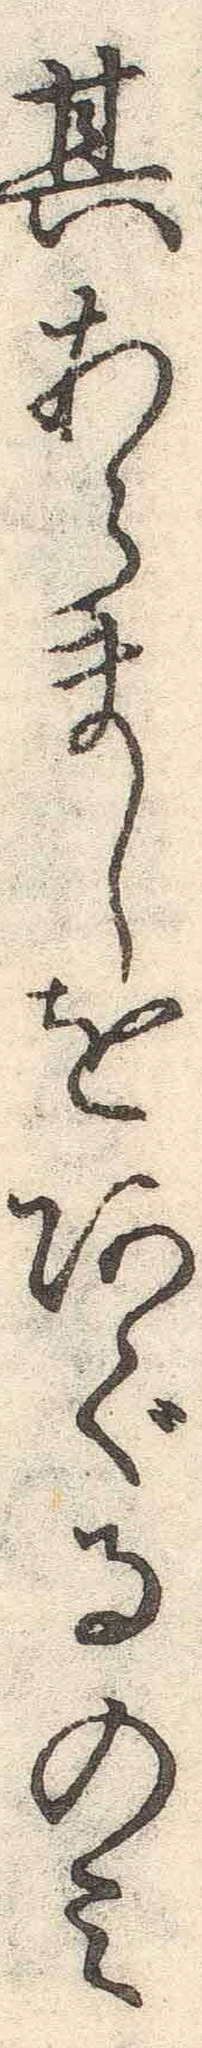其あらましをあぐるのみ
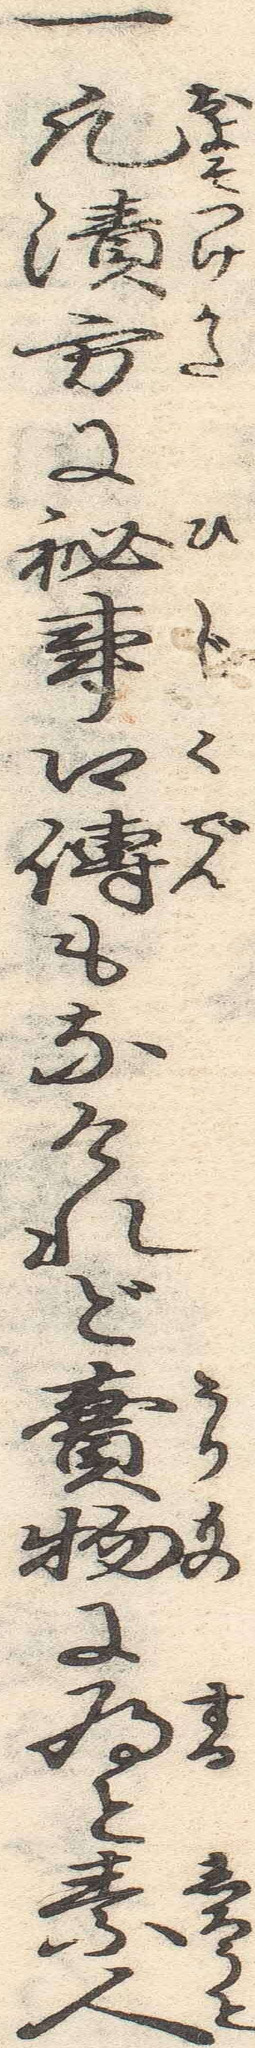一凡漬方に秘事口伝もなけれど売物に為と素人
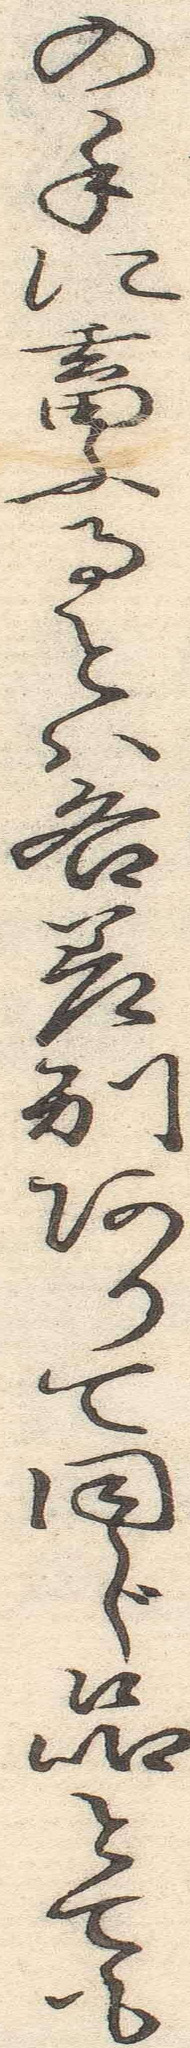の手に蓄ふるとは各差別ありて同じ品とても
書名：四季漬物塩嘉言
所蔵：東京学芸大学附属図書館 国文学研究資料館
